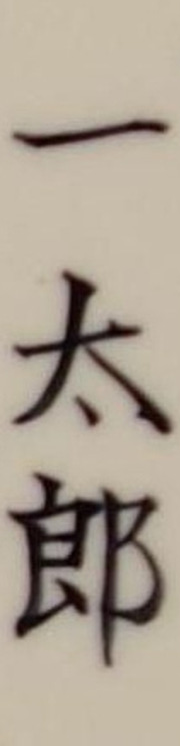一太郎
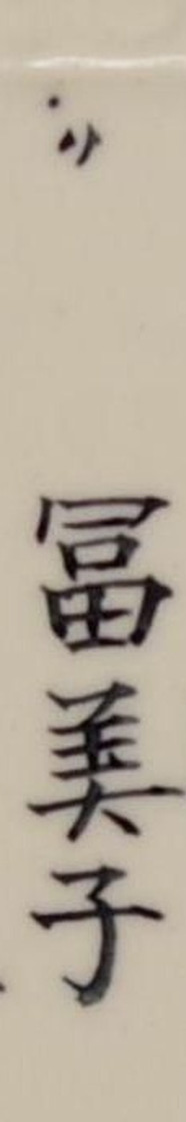冨美子
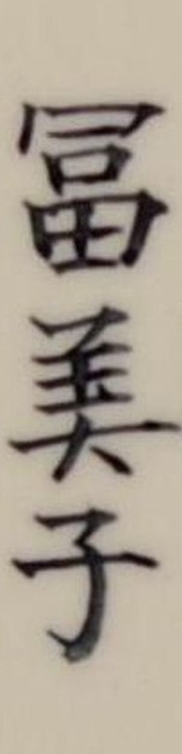冨美子
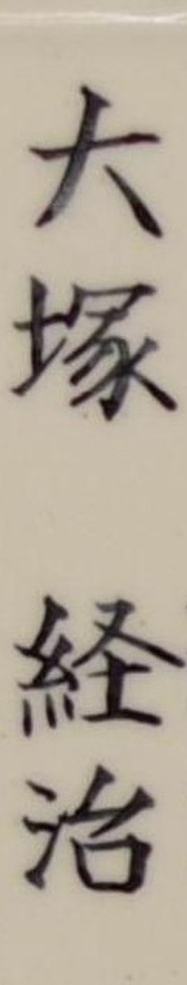大塚経治
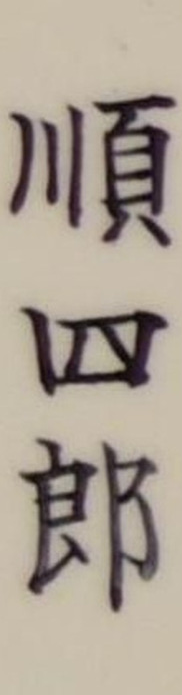順四郎

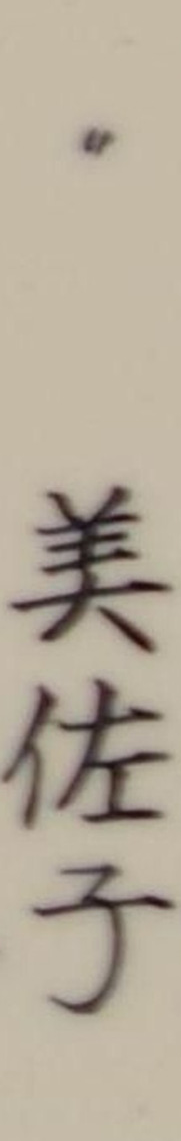美佐子
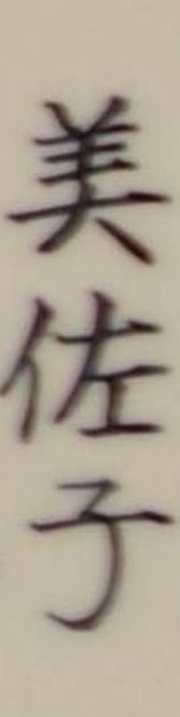美佐子
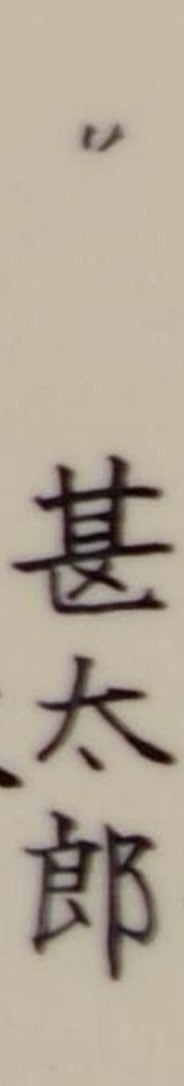甚太郎
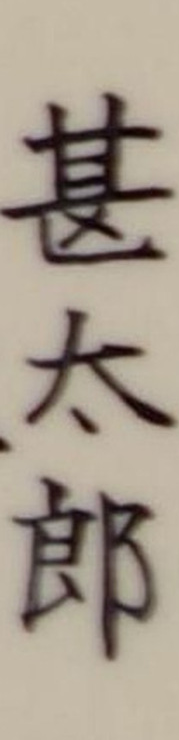甚太郎
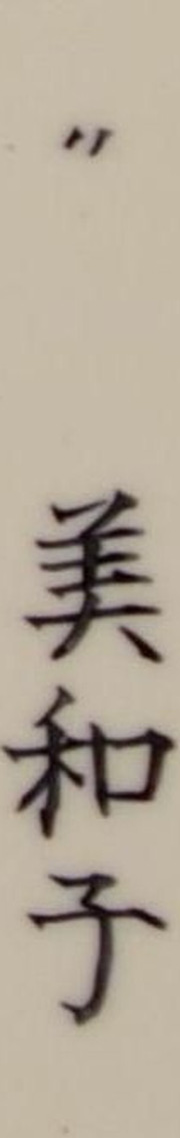美和子
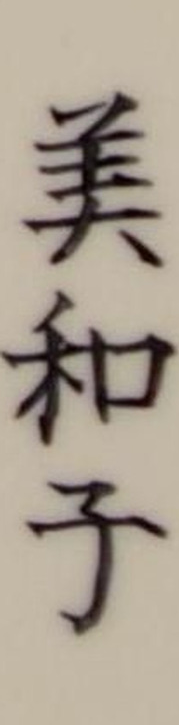美和子
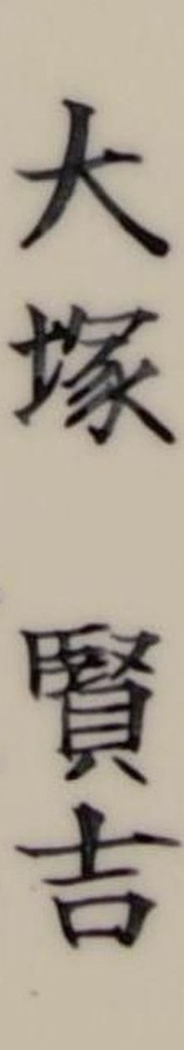大塚賢吉
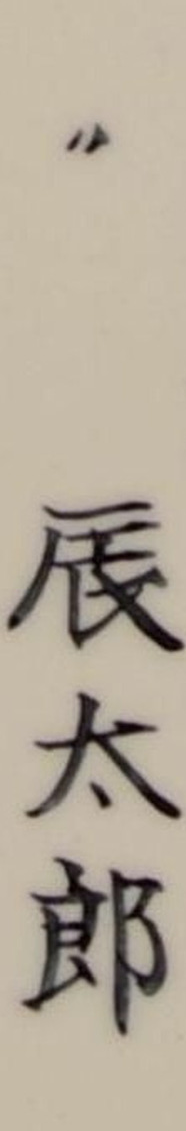辰太郎
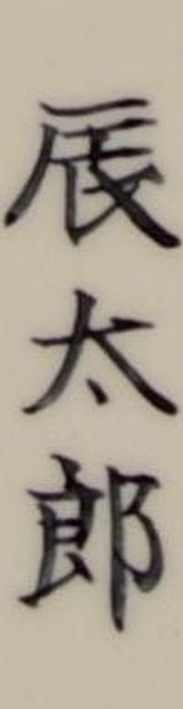辰太郎
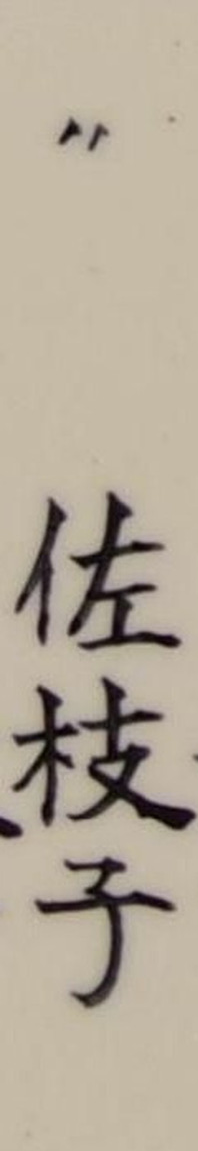佐枝子
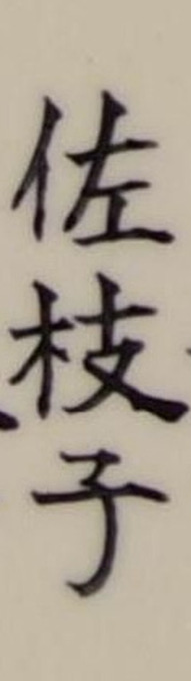佐枝子
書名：M~S
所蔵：高野山金剛峯寺
